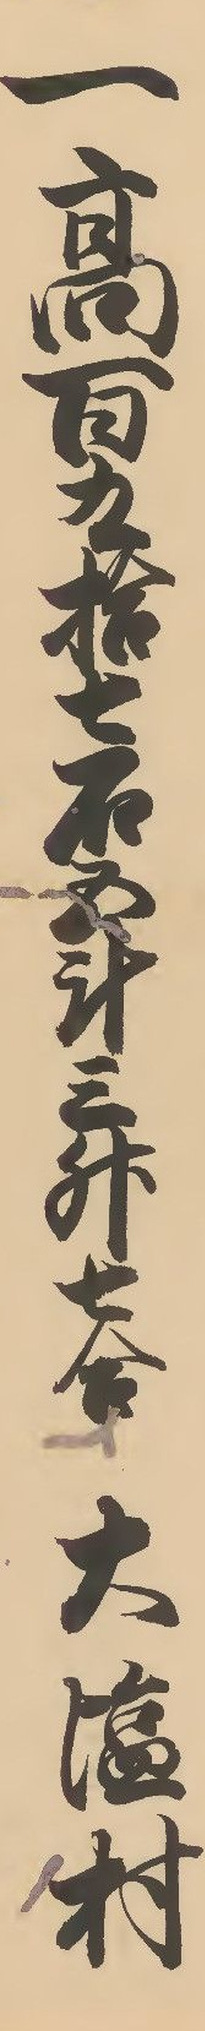一高百九拾七石五斗三升七合大塩村

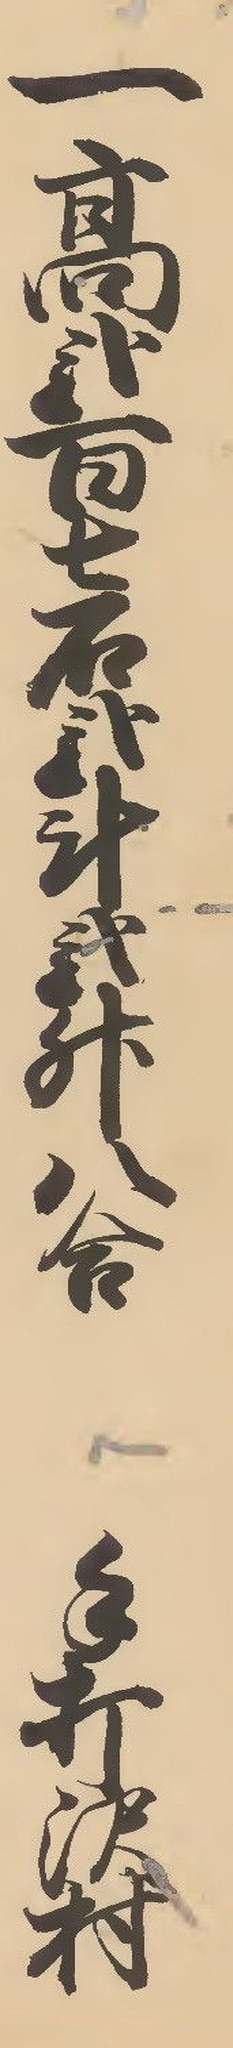一高弐百七石弐斗弐升八合手打沢村
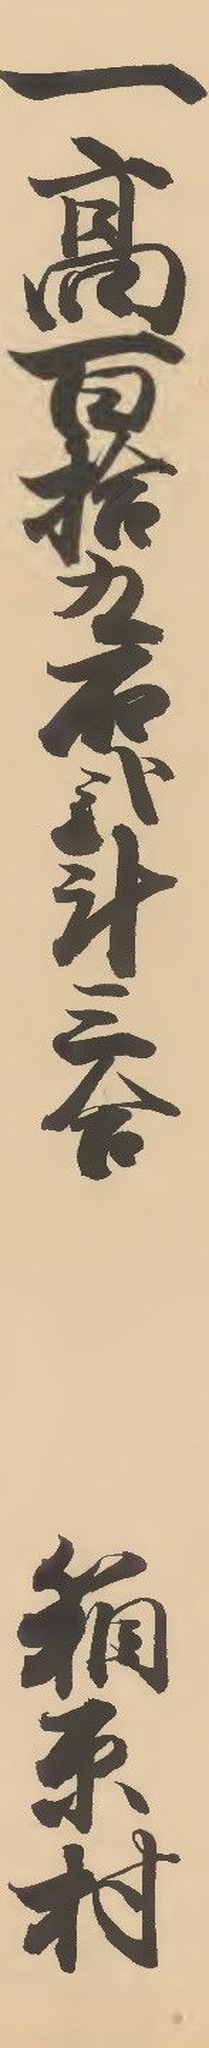一高百拾九石弐斗三合箱原村
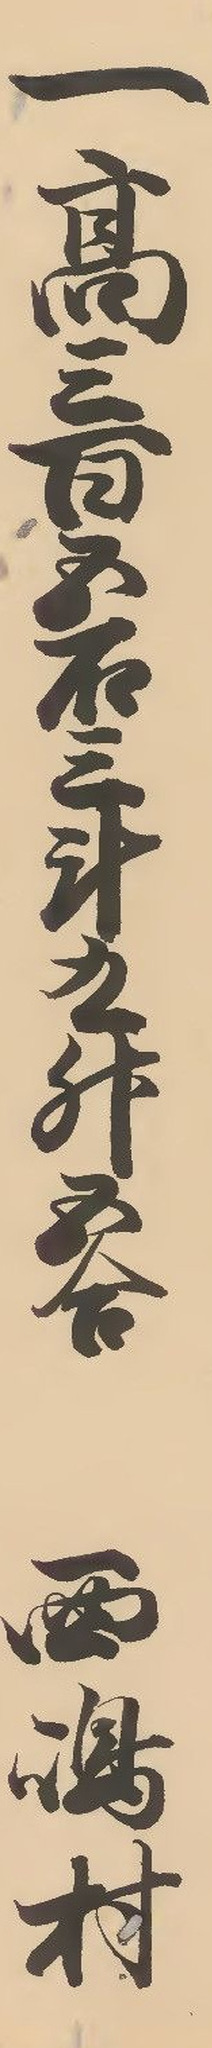一高三百五石三斗九升五合西島村
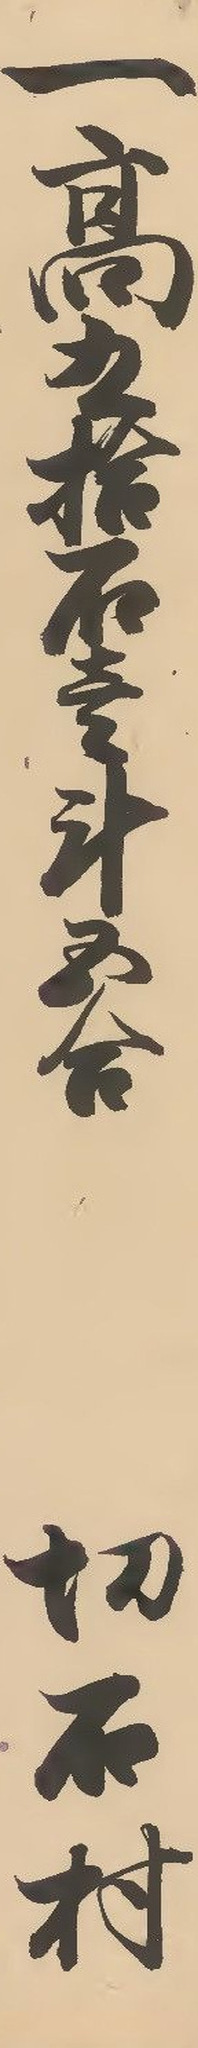一高九拾石壱斗五合切石村
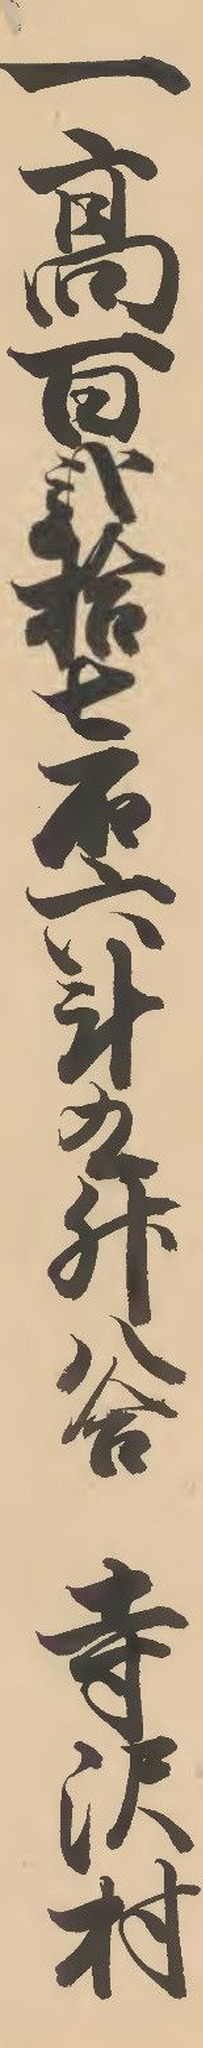一高百弐拾七石六斗九升八合寺沢村
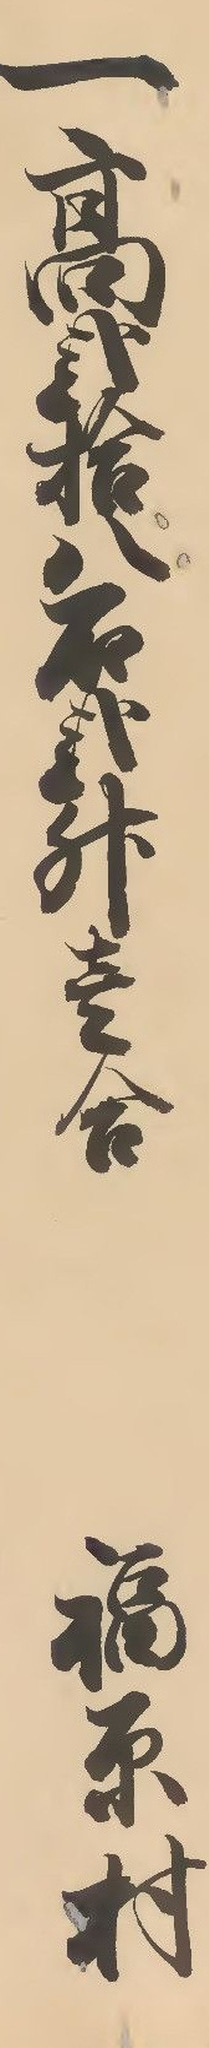一高弐拾八石弐升壱合福原村
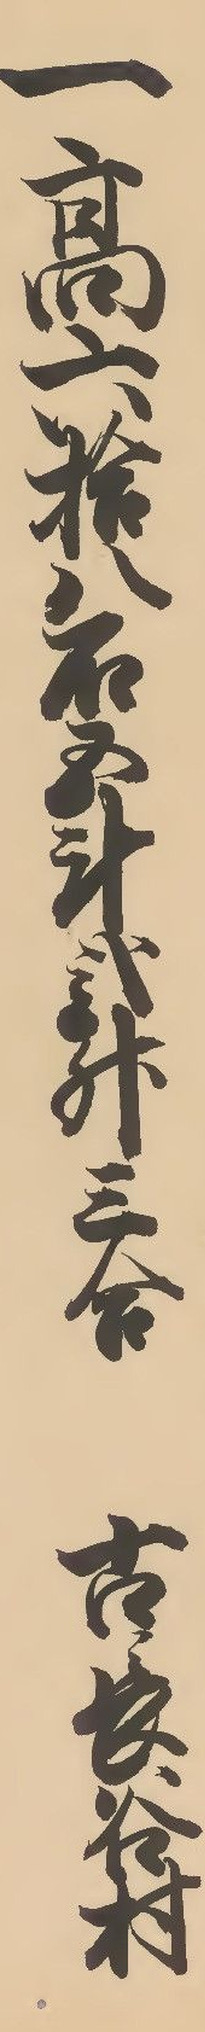一高六拾八石五斗弐升三合古長谷村
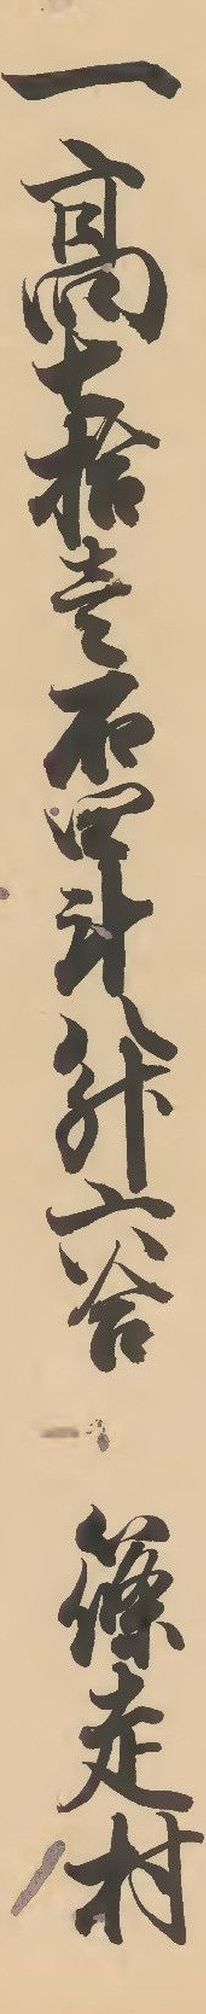一高七拾壱石四斗八升六合篠走村

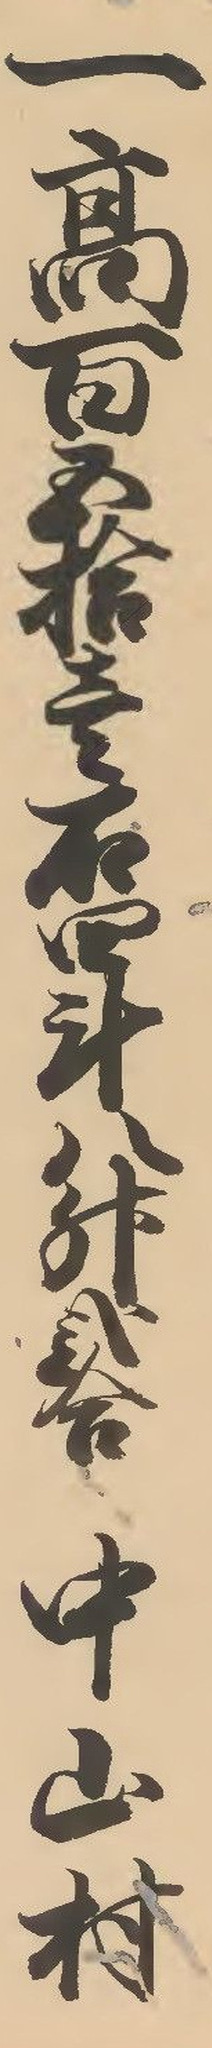一高百五拾壱石四斗八升弐合中山村
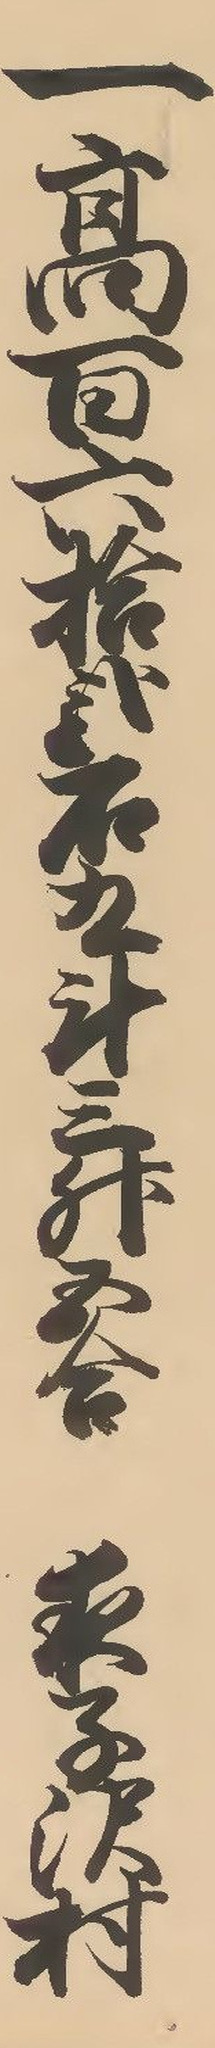一高百六拾弐石九斗三升五合夜子沢村
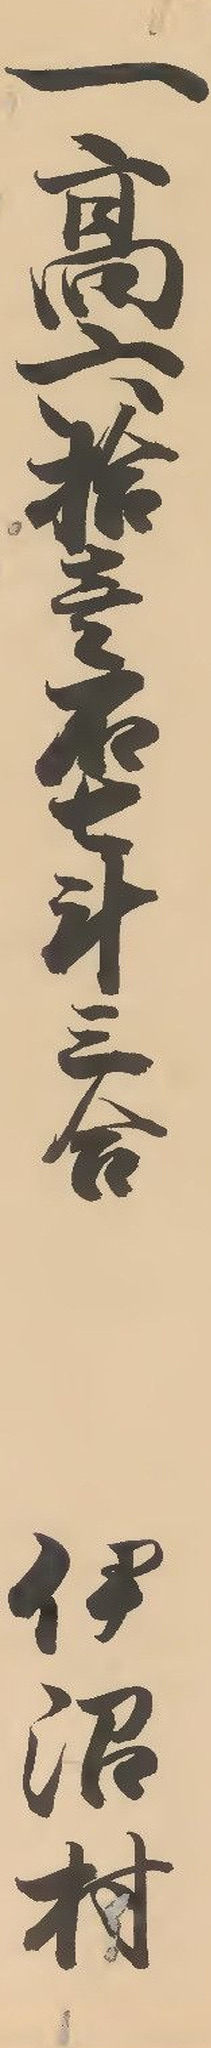一高六拾壱石七斗三合伊沼村
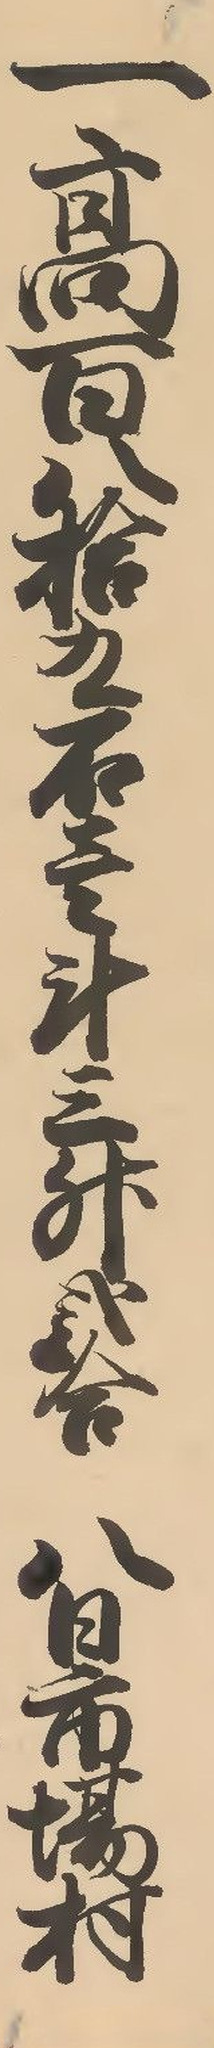一高百八拾九石壱斗三升弐合八日市場村
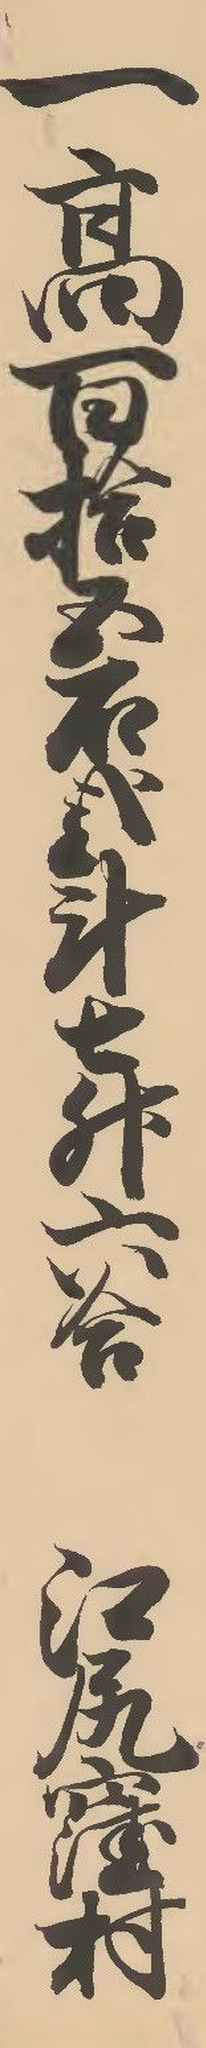一高百拾五石弐斗七升六合江尻窪村
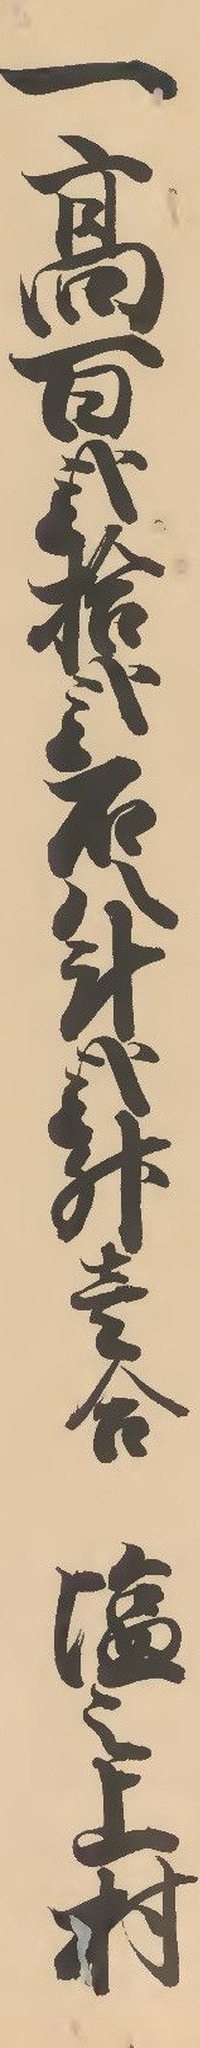一高百弐拾弐石八斗弐升壱合塩之上村
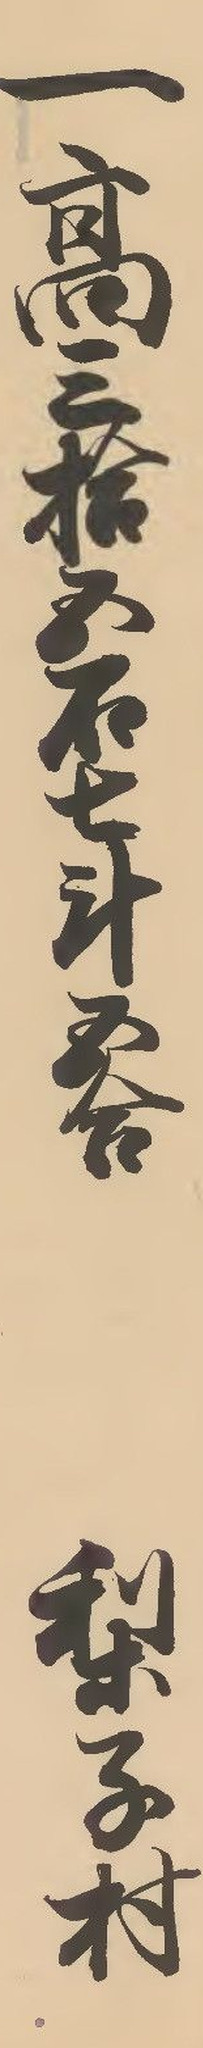一高三拾五石七斗五合梨子村
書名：甲斐国郷帳
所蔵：国立公文書館 National Archives of Japan
